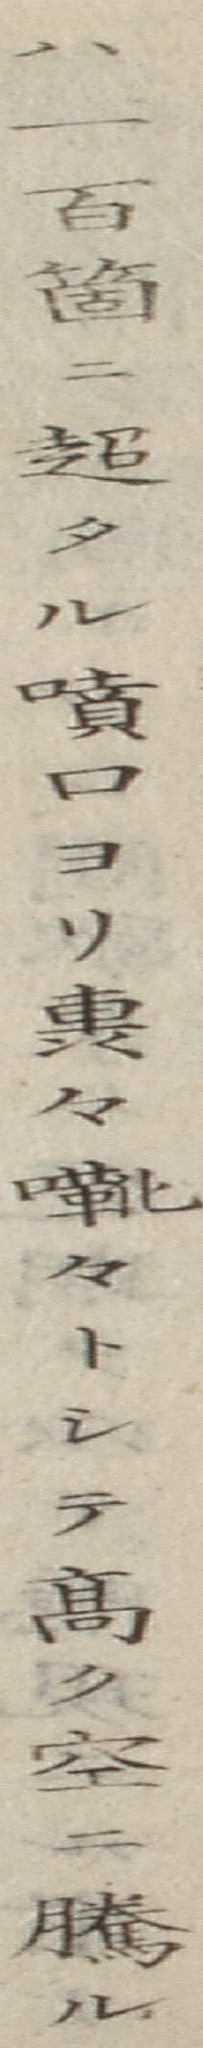ハ一百箇ニ超タル噴口ヨリ轟々靴々トシテ高ク空ニ騰ル
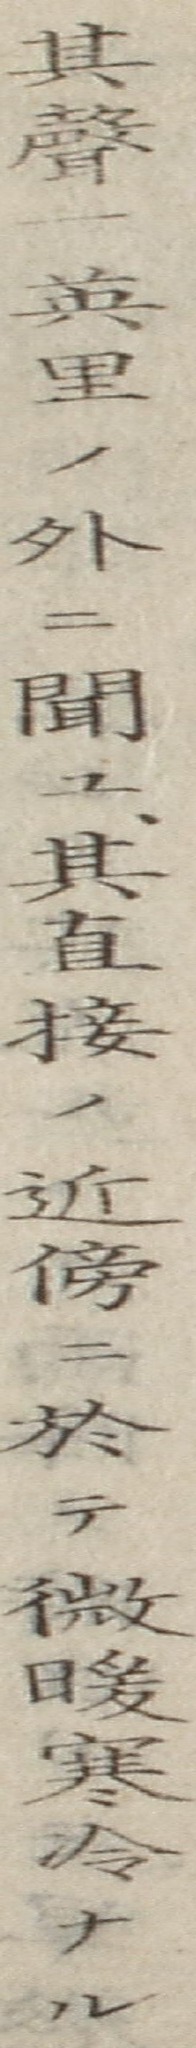其声一英里ノ外ニ聞ユ、其直接ノ近傍ニ於テ微暖寒冷ナル
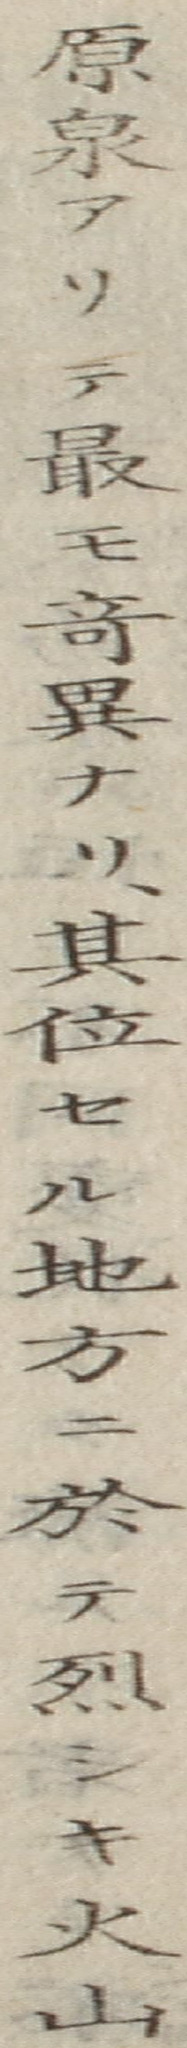原泉アリテ最モ奇異ナリ其位セル地方ニ於テ烈シキ火山
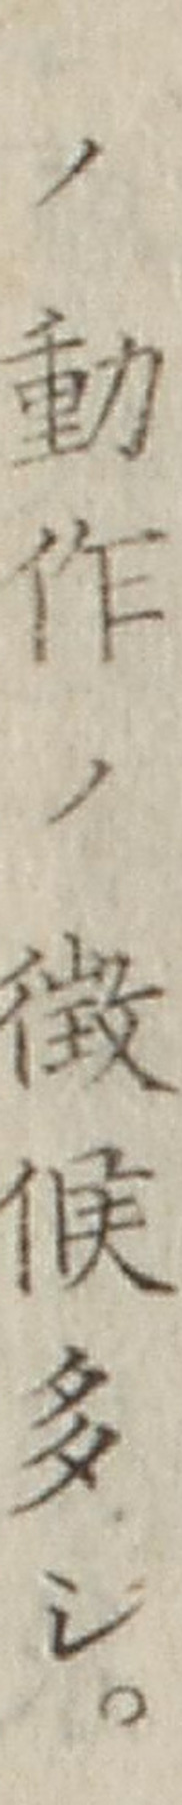ノ動作ノ徴候多シ。
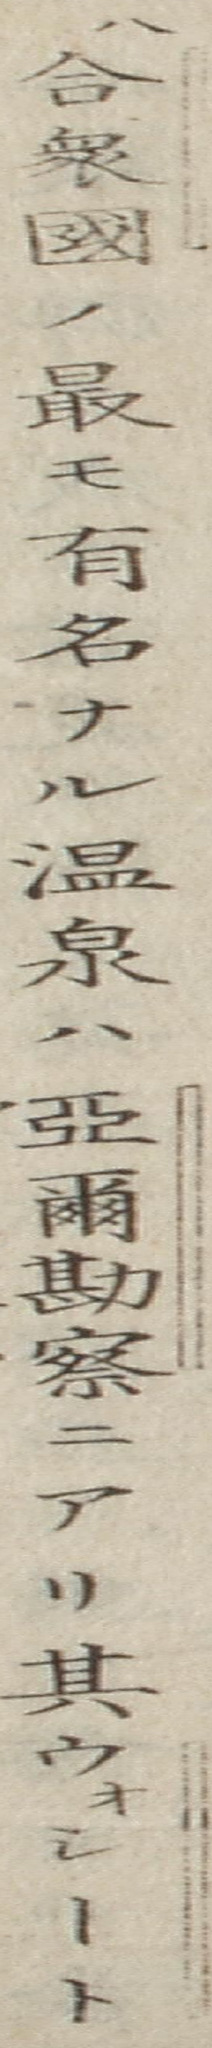八合衆国ノ最モ有名ナル温泉ハ亜爾勘察ニアリ其ウォシート
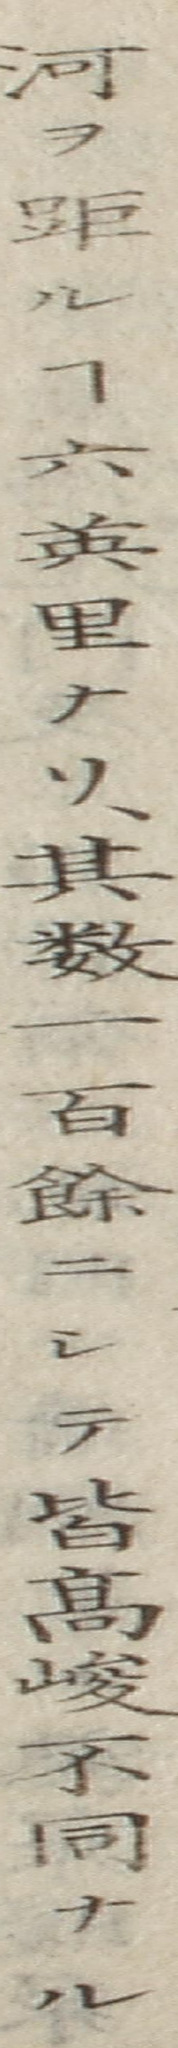河ヲ距ルヿ六英里ナリ、其数一百余にして皆高峻不同ナル
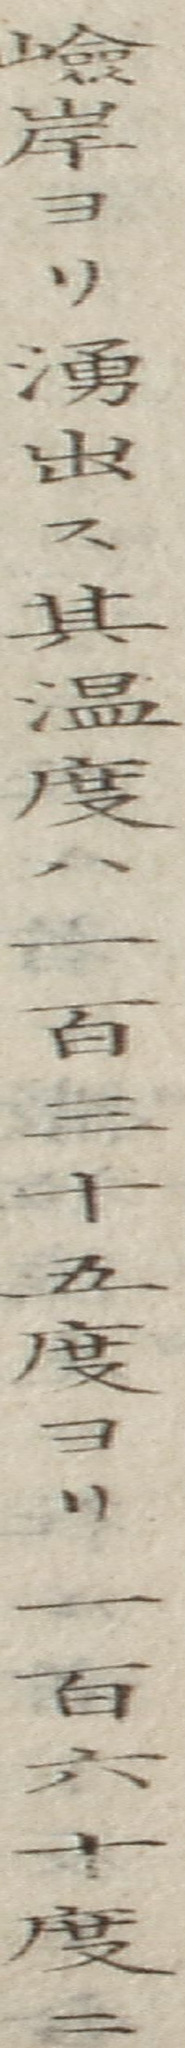嶮岸ヨリ湧出ス其温度ハ一百三十五度ヨリ一百六十度ニ
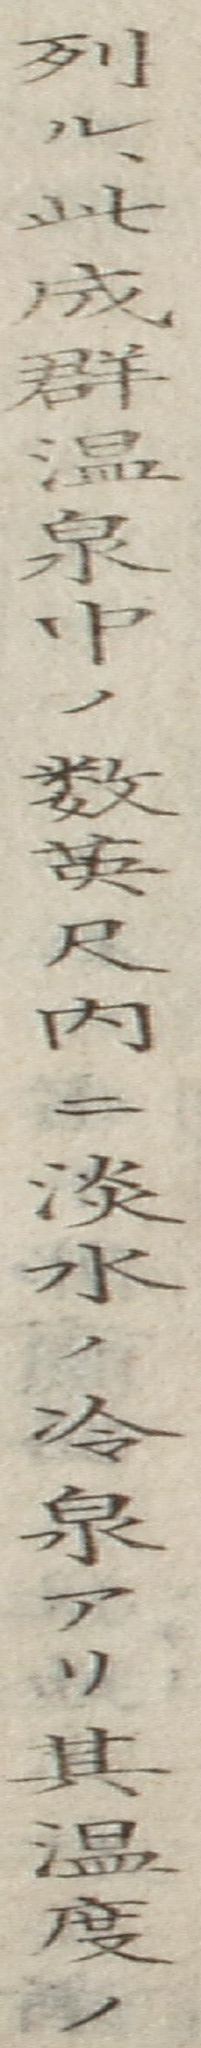列ル、此成群温泉中ノ数英尺内ニ淡水ノ冷泉アリ其温度ノ
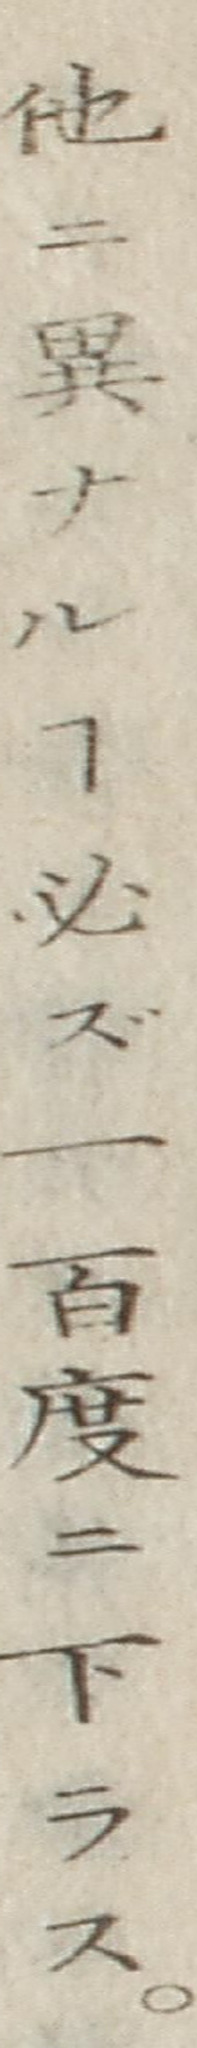他ニ異ナルヿ必ズ一百度ニ下ラス。
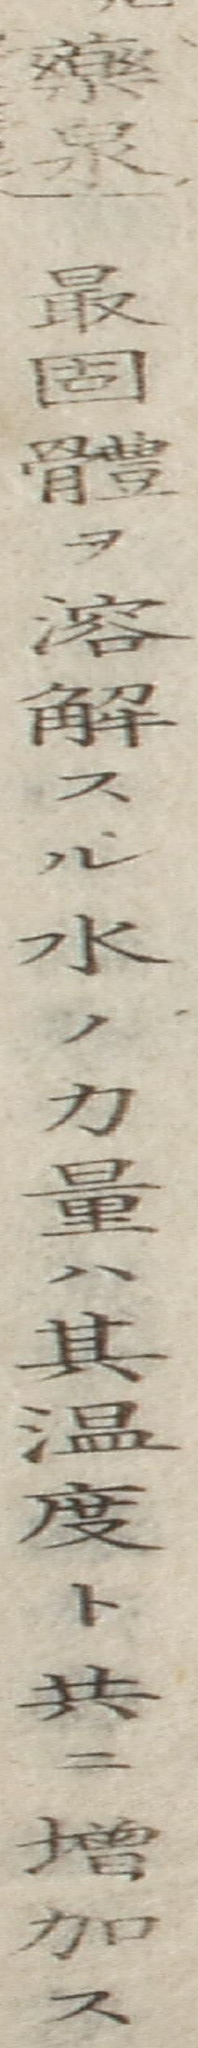九〔薬泉〕最固体ヲ溶解スル水ノ力量ハ其温度ト共ニ増加ス
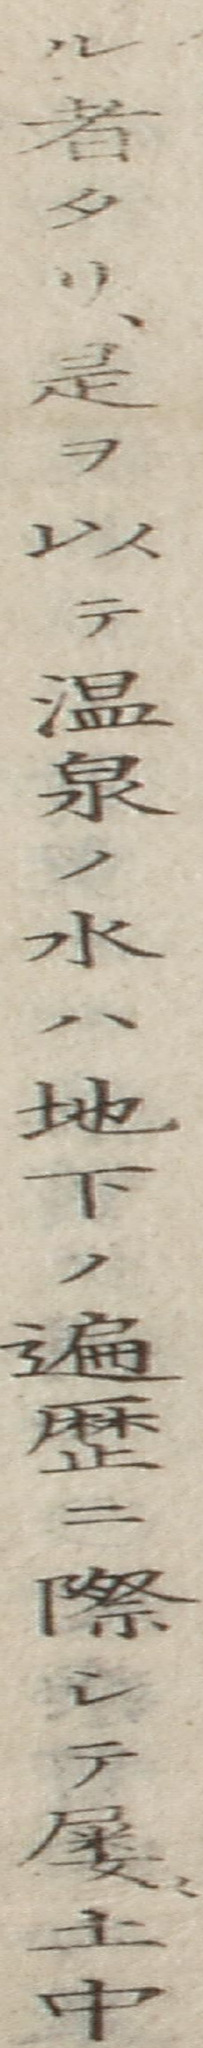ル者タリ、是ヲ以テ温泉ノ水ハ地下ノ遍歴ニ際シテ屡々土中

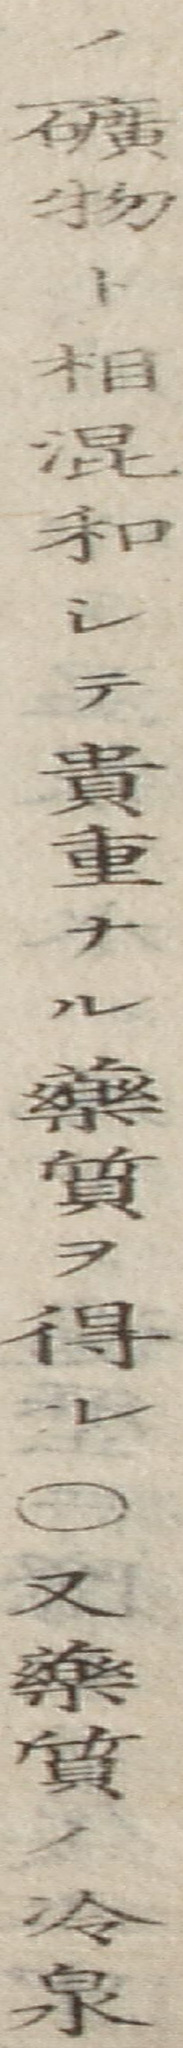ノ鉱物ト相混和シテ貴重ナル薬質ヲ得ル○又薬質ノ冷泉
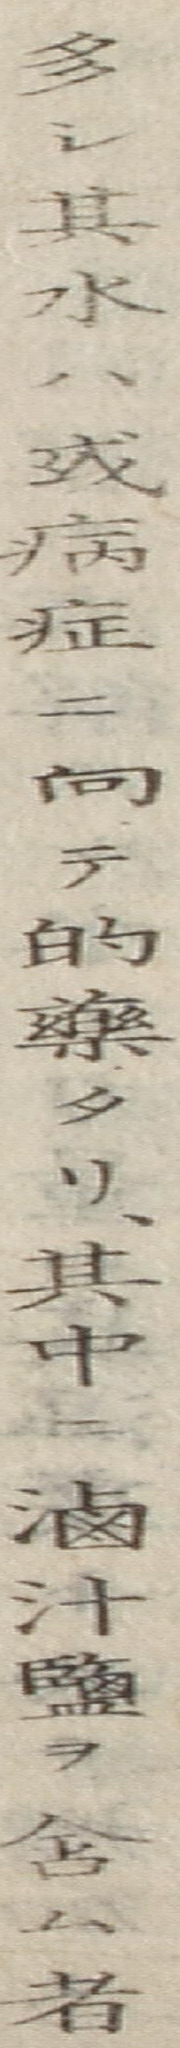多シ其水ハ或病症ニ向テ的薬タリ、其中ニ滷汁塩ヲ含ム者
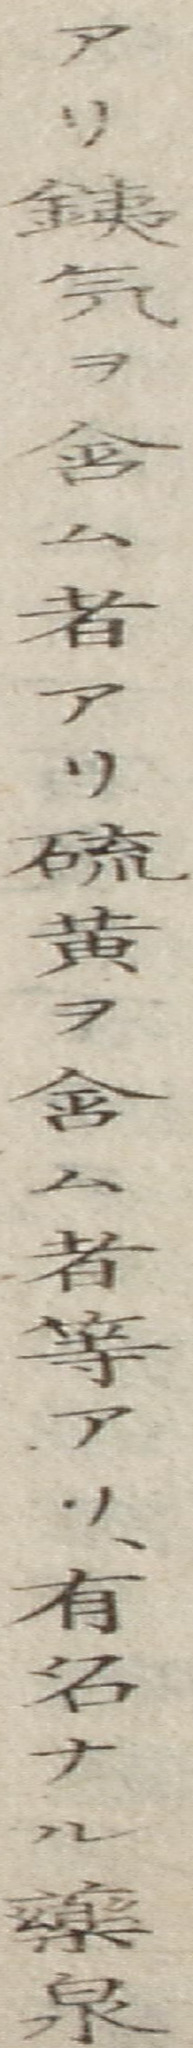アリ鉄気ヲ含ム者アリ硫黄ヲ含ム者等アリ、有名ナル薬泉
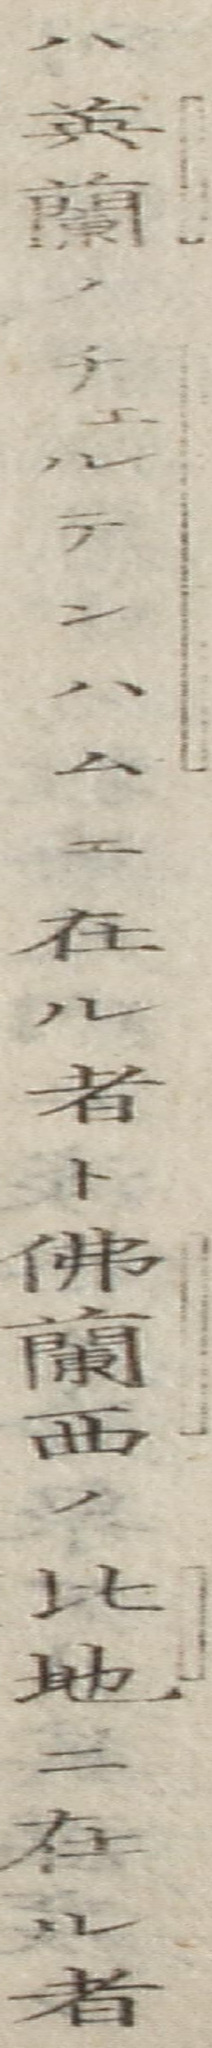ハ英蘭ノチェルテンハムニ在ル者ト仏蘭西ノ比地ニ在ル者
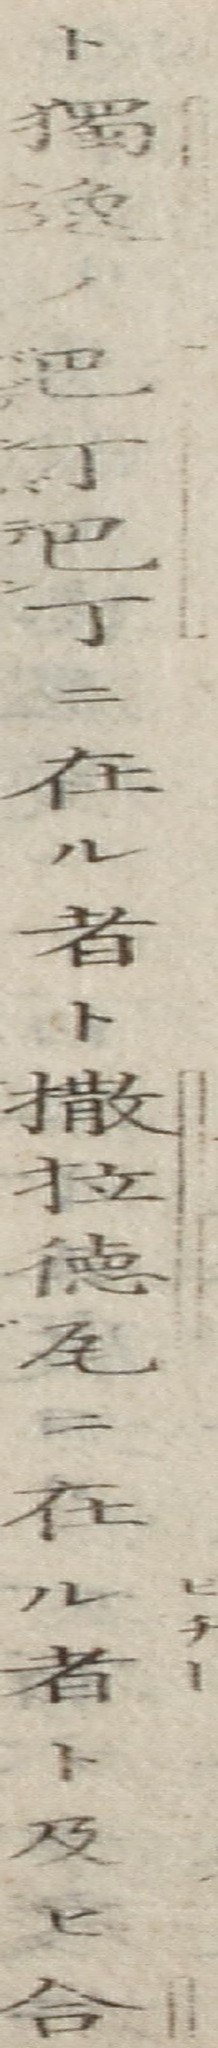ト独逸ノ巴丁巴丁ニ在ル者ト撒拉徳瓦ニ在ル者ト及ヒ合
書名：地形論　巻二
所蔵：東京大学地震研究所図書室 Earthquake Research Institute Library, The University of Tokyo, JAPAN
